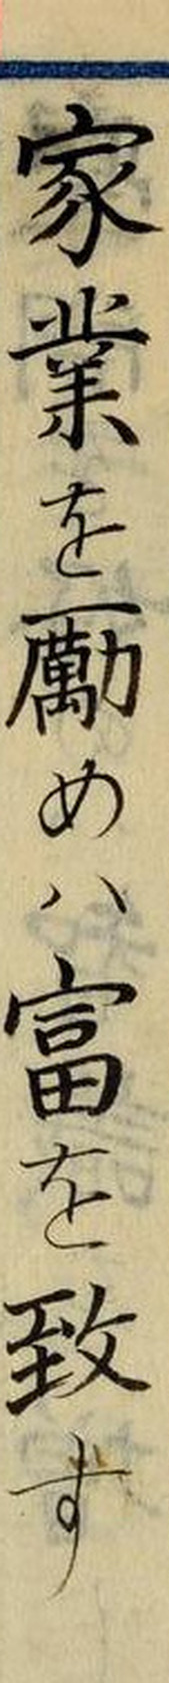家業を励めハ富を致す
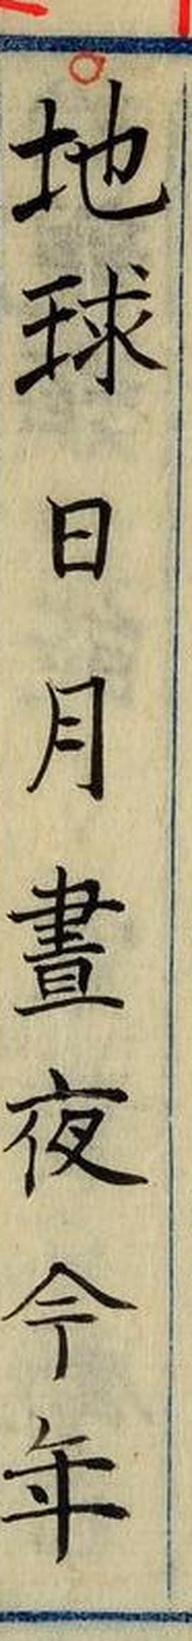〇地球日月昼夜今年
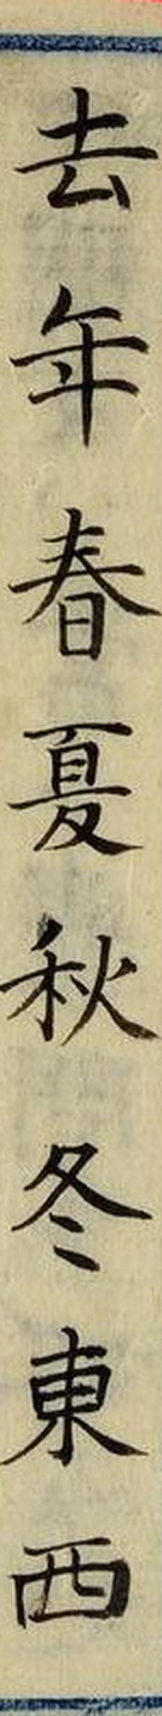去年春夏秋冬東西
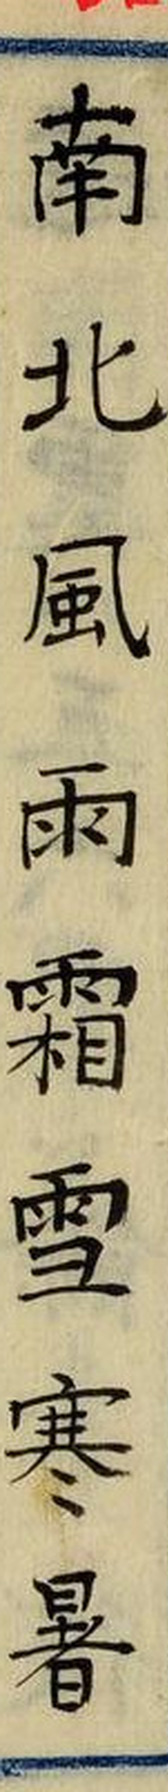南北風雨霜雪寒暑
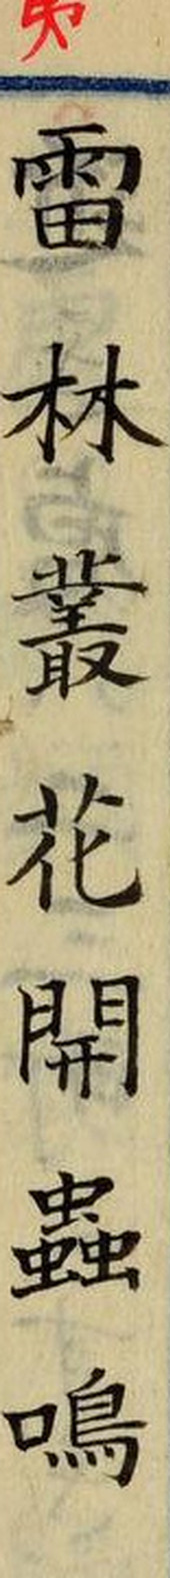雷林草花開虫鳴
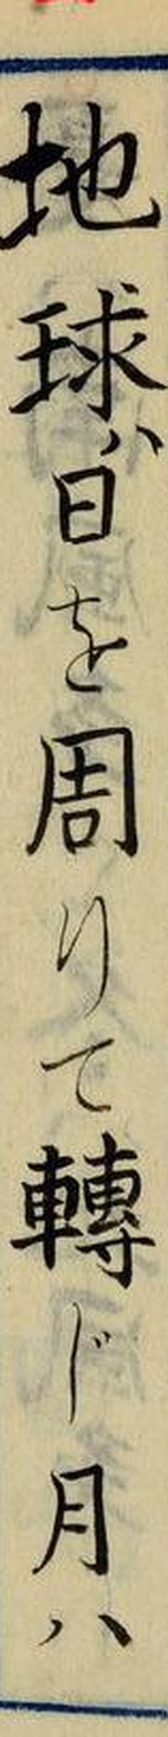地球ハ日を周りて転じ月ハ
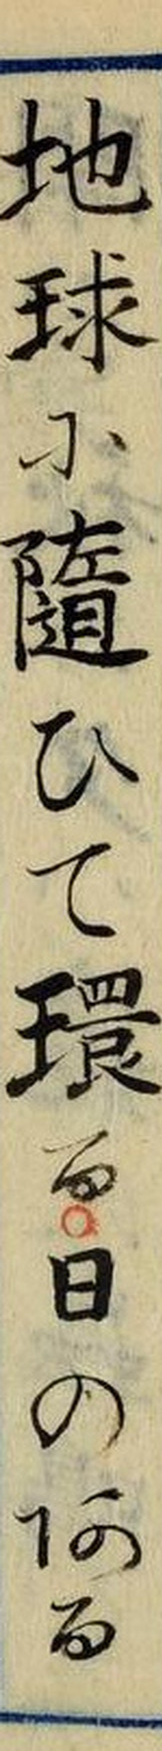地球に随ひて環る〇日のある
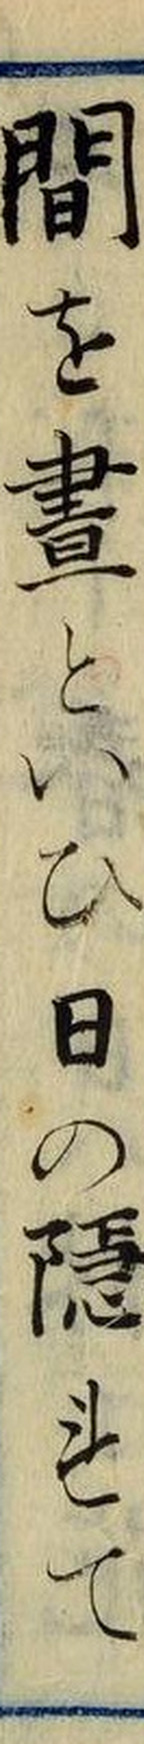間を昼といひ日の隠れて
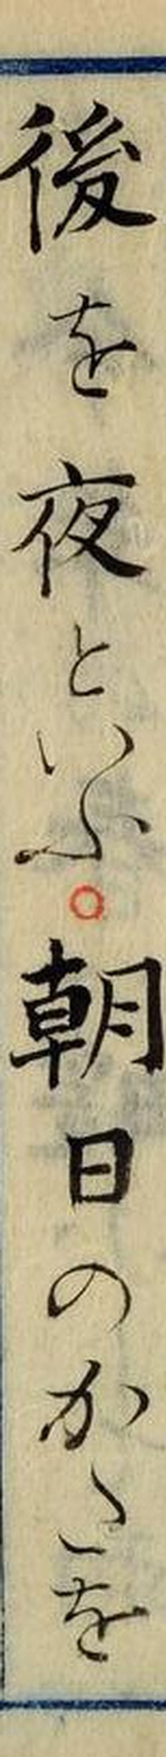後を夜といふ〇朝日のかたを
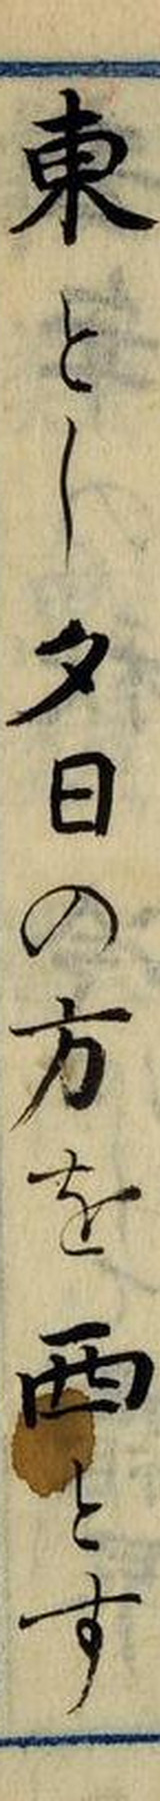東とし夕日の方を西とす

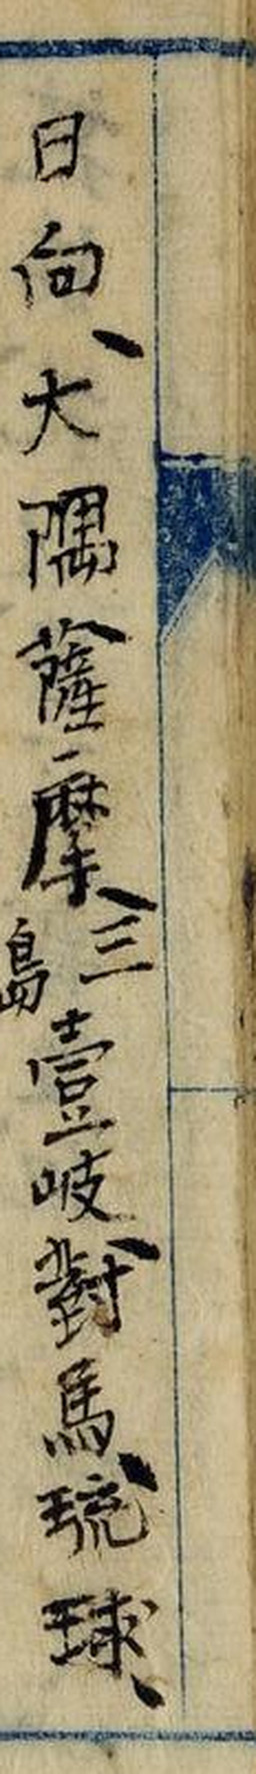日向、大隈、薩摩、三島壱岐、対馬、琉球
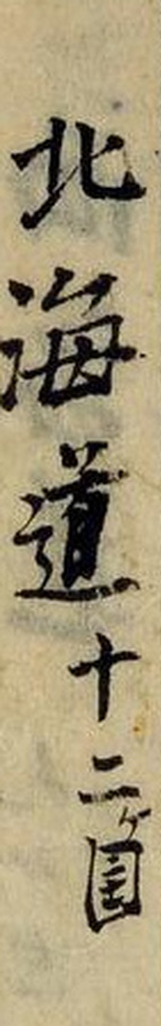北海道十二ケ国
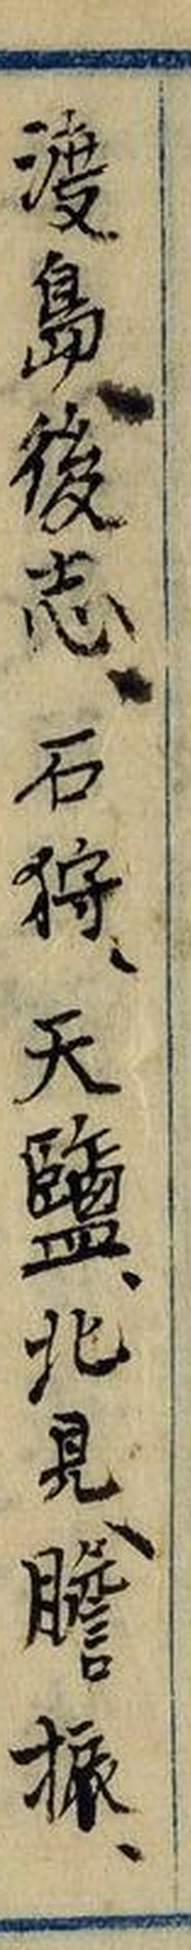渡島、後志、石狩、天鹽、北見、膽振、
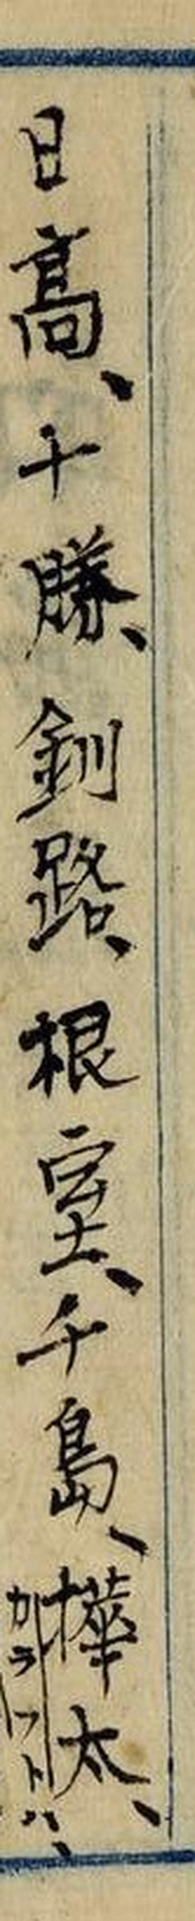日高、十勝、釧路、根室、千島、樺太、
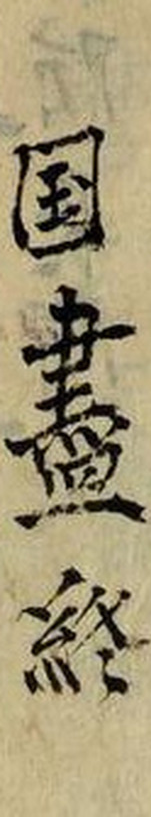国尽終
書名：村名・連語
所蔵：福井県文書館 Fukui Prefectural Archives
